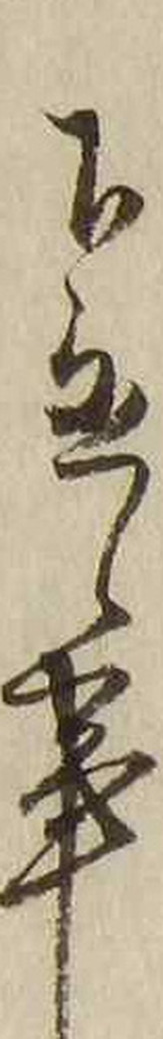下置候事
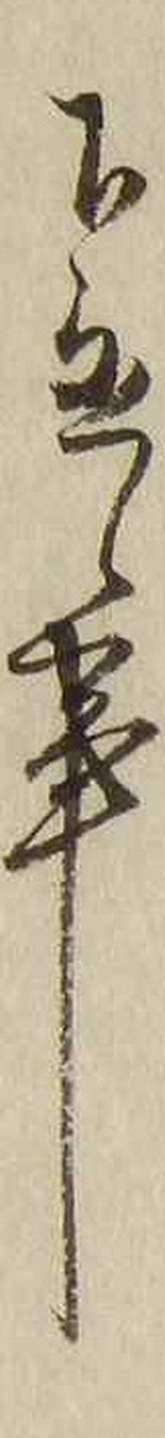下置候事

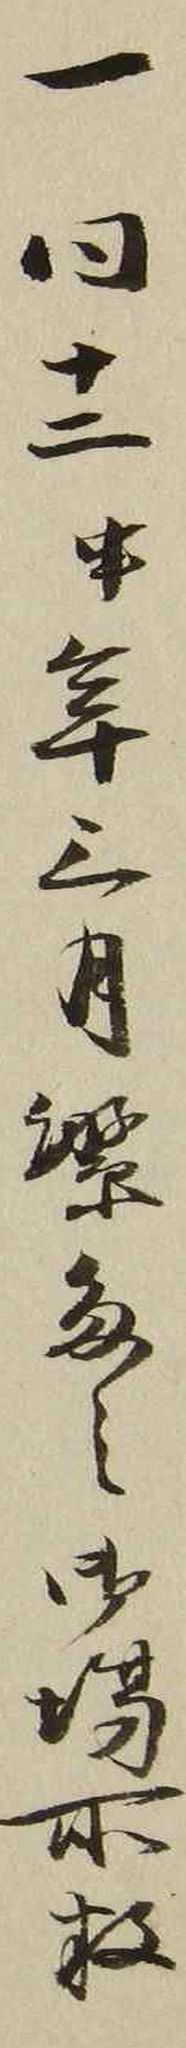一同十二申年三月繁多之御場所枚
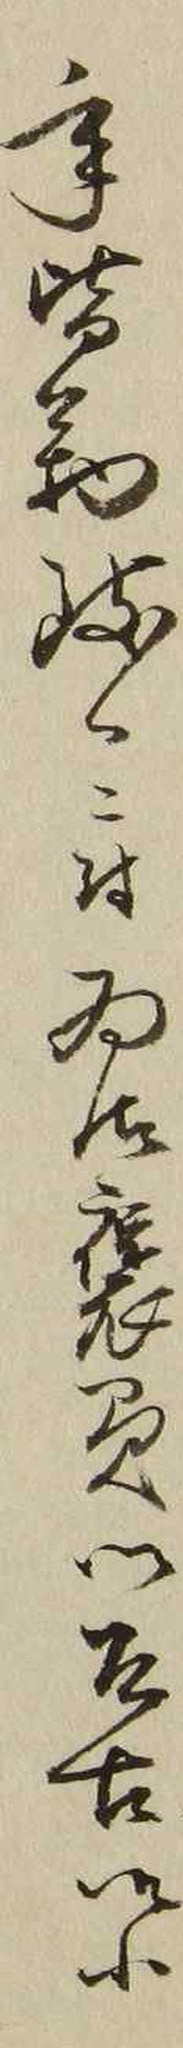年皆勤致候に付為御褒美御召御古御小
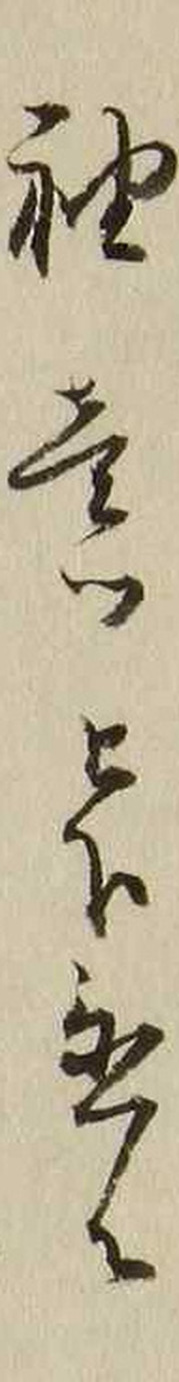袖壱つ被下置候事
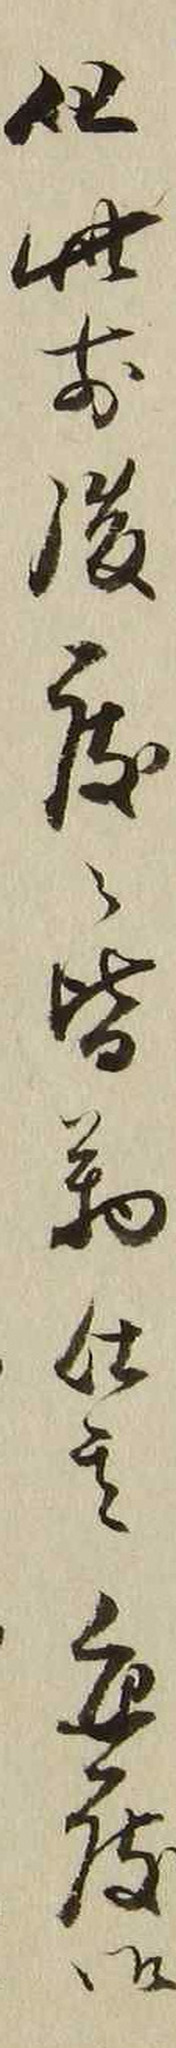但此前後度々皆勤仕其毎度御
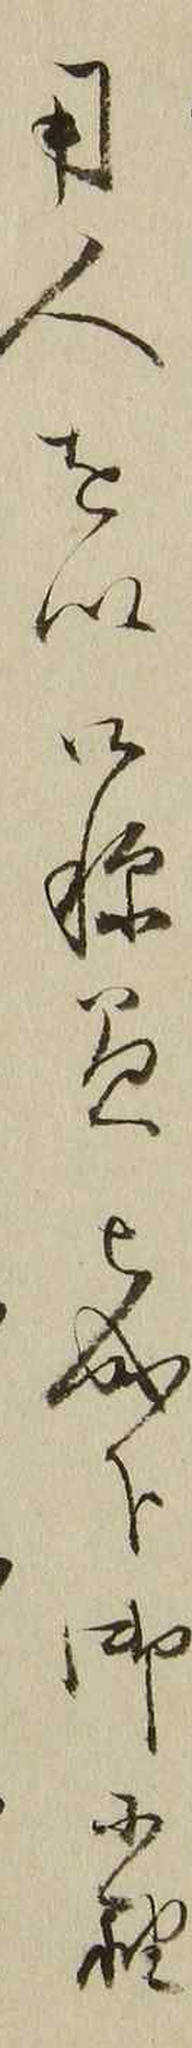用人を以御称美被成下御小袖
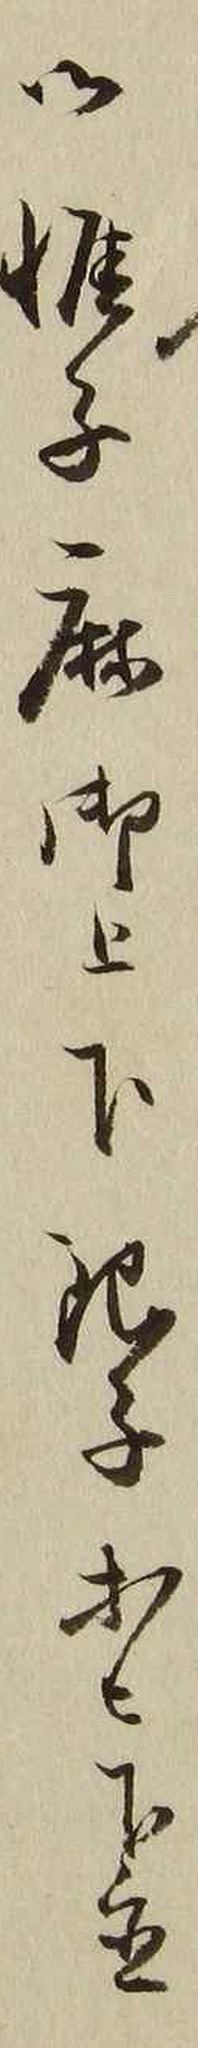御帷子麻御上下銀子等被下置
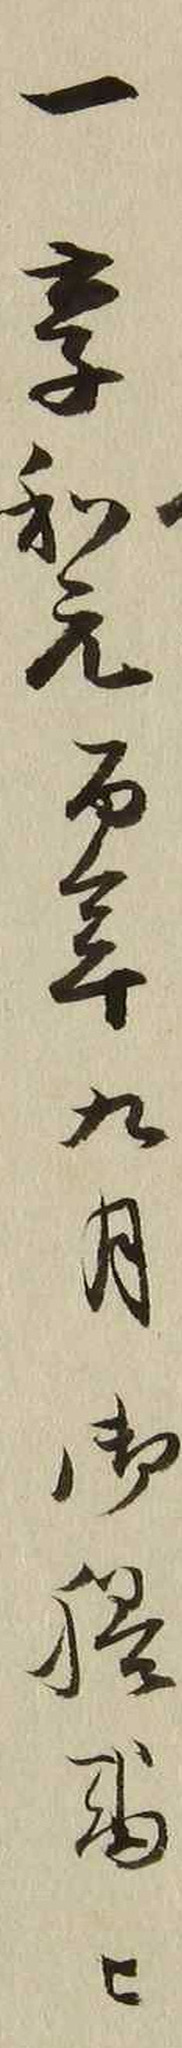一享和元酉年九月御膳番被
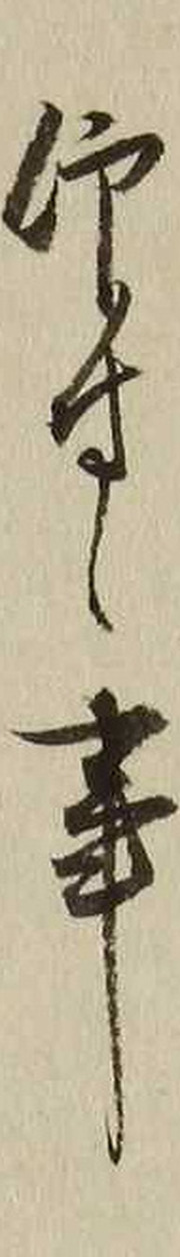仰付候事
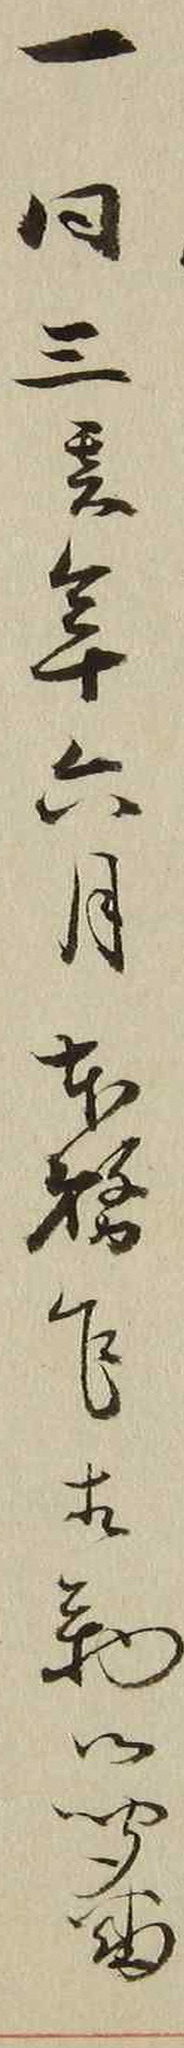一同三亥年六月本務乍相勤御聞番
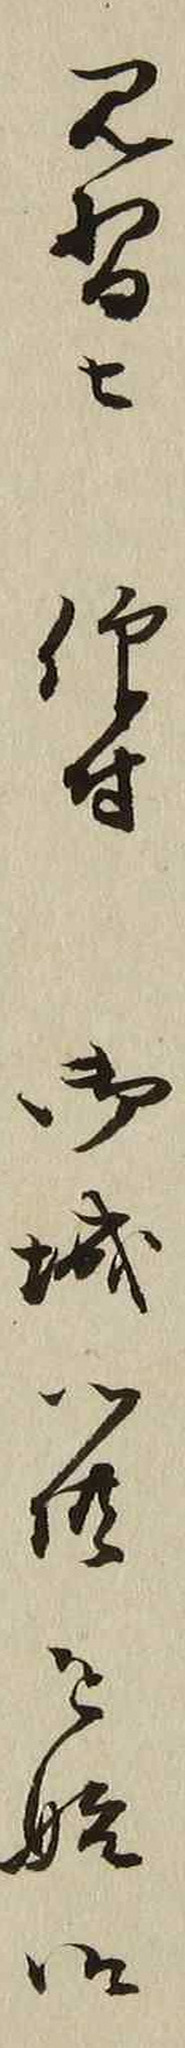見習被仰付御城御供を始御
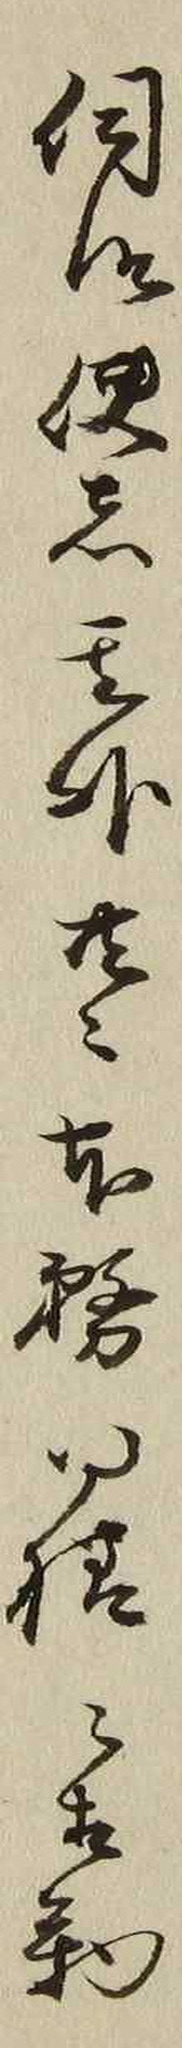伺御使者其外共に本務同様に相勤
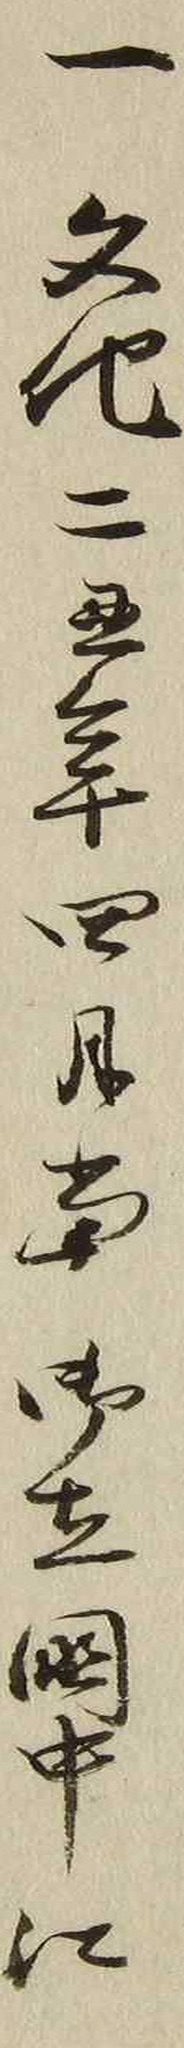一文化二丑年四月当御在国中江
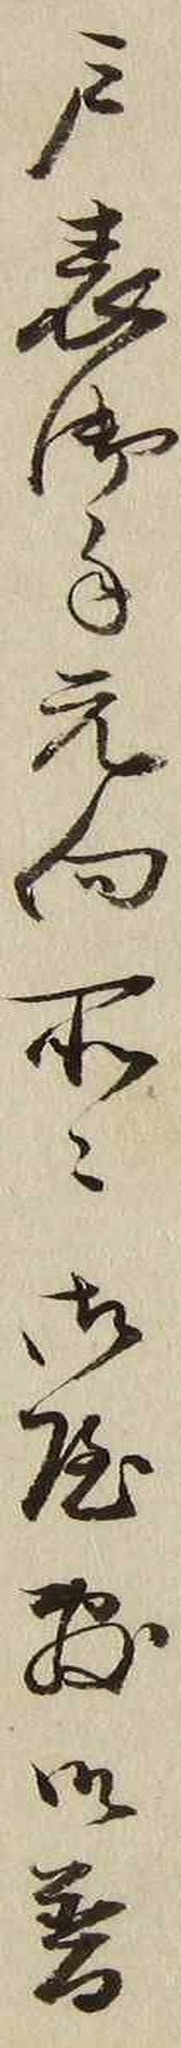戸表御手元向所々御屋敷御普
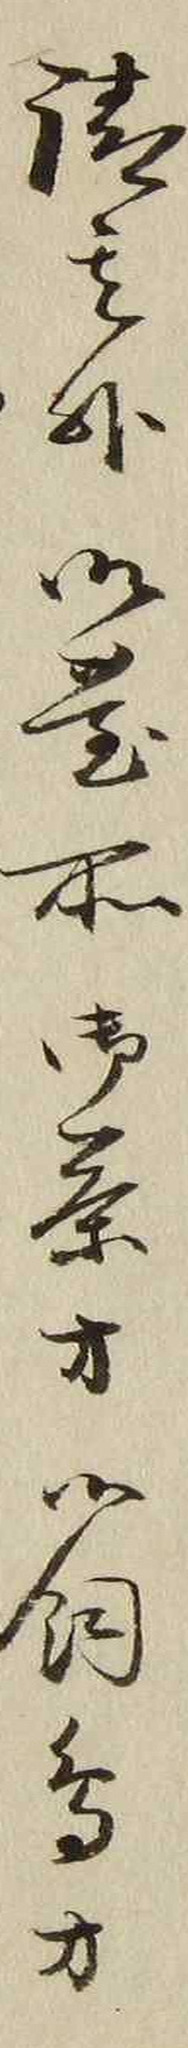請其外御台所御茶方御飼鳥方
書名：諸士系譜　巻之292　き之部1
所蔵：会津若松市立会津図書館
